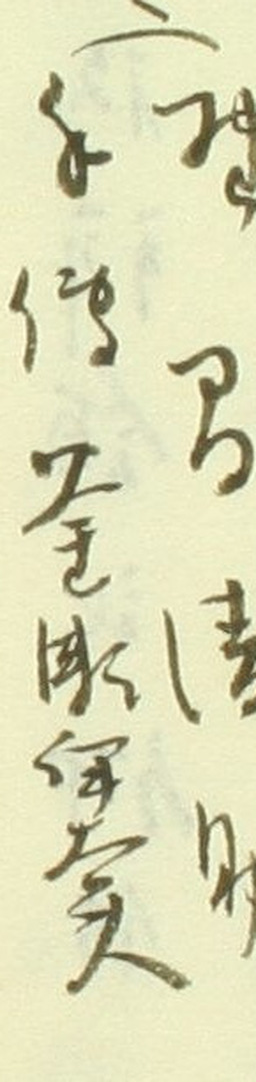手伝釜瀬伊太夫
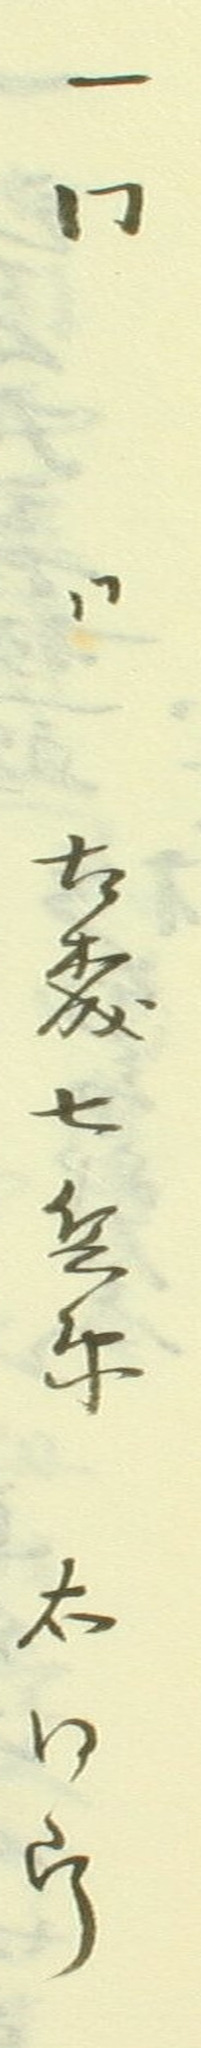一同同古森七兵衛右同断
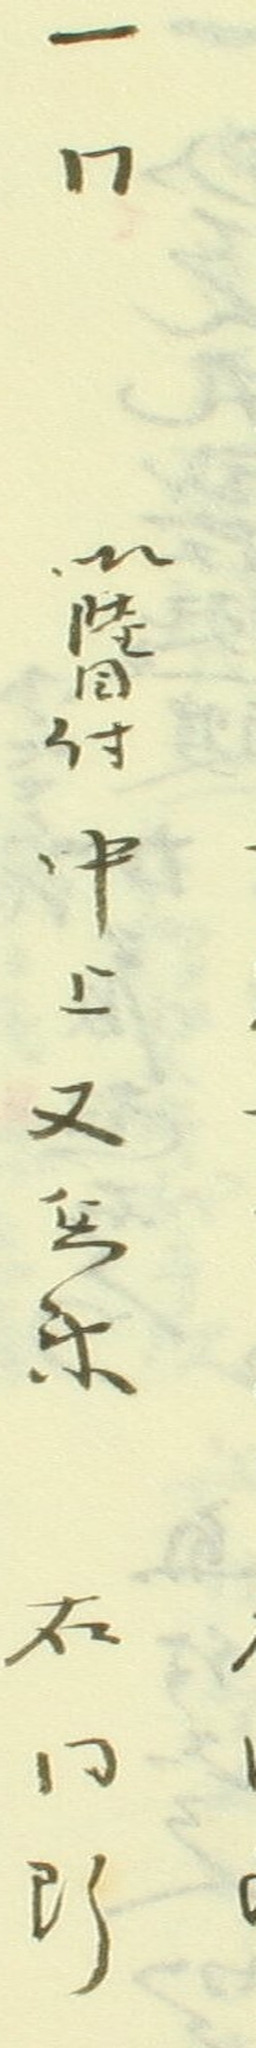一同御陸目付中上又兵衛右同断
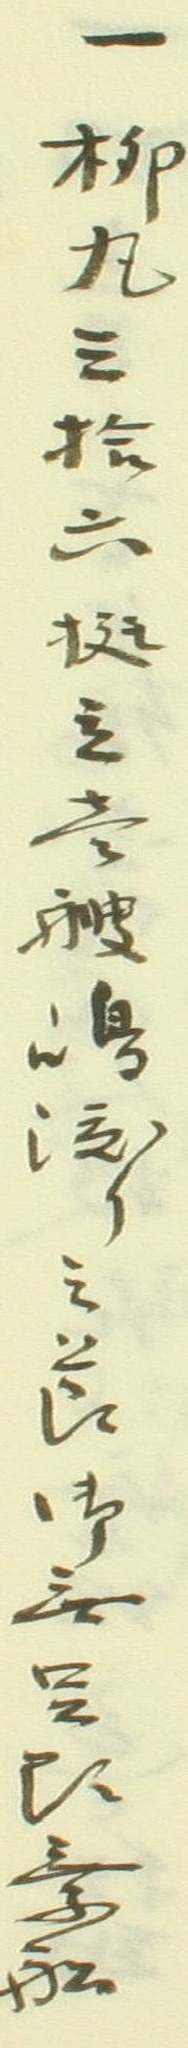一柳丸三拾六挺立壱艘嶋渡り之節御無足頭乗船
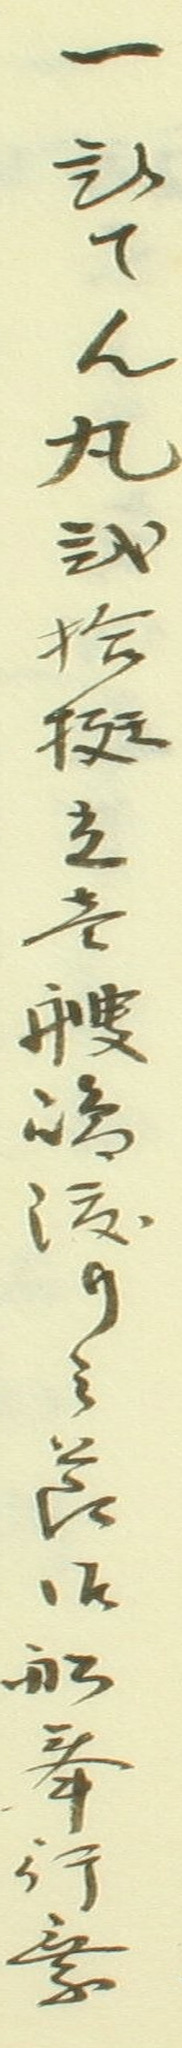一ひてん丸弐拾挺立壱艘嶋渡り之節御船奉行乗
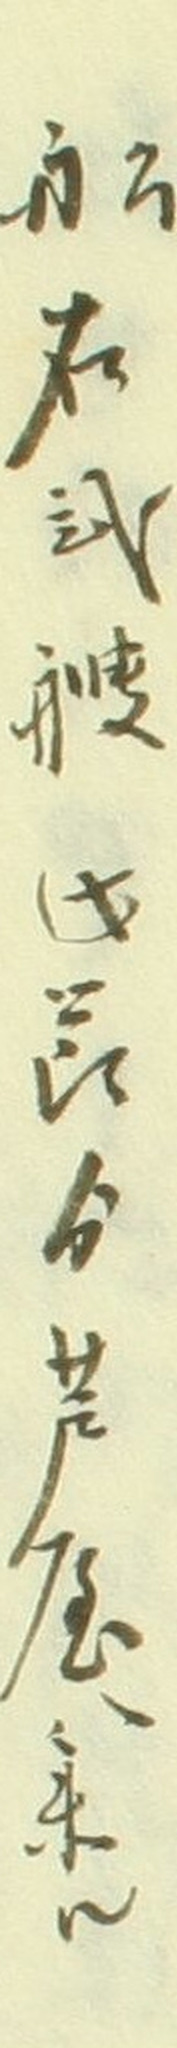船右弐艘此節ゟ芦屋へ参る
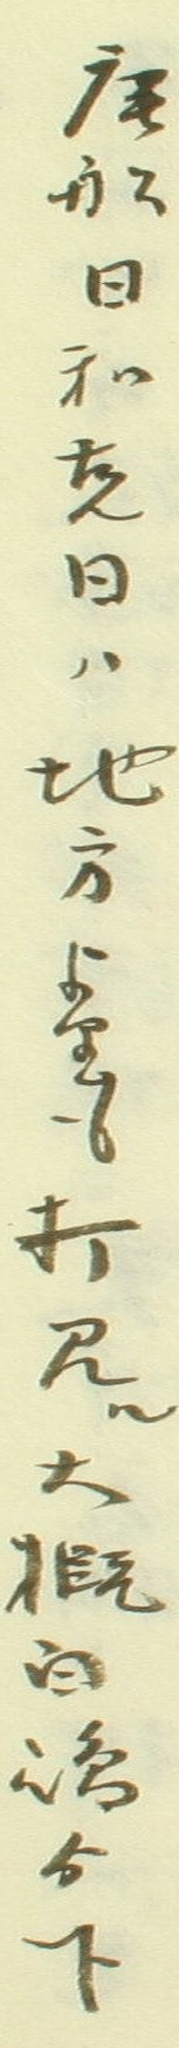唐船日和？日は地方よりも打見る大概白嶋ゟ下
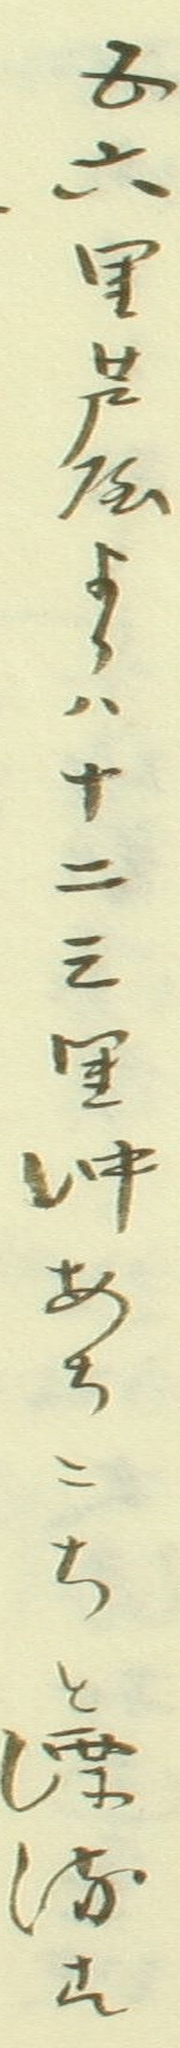五六里芦屋よりは十二三里沖あちこちと漂流す
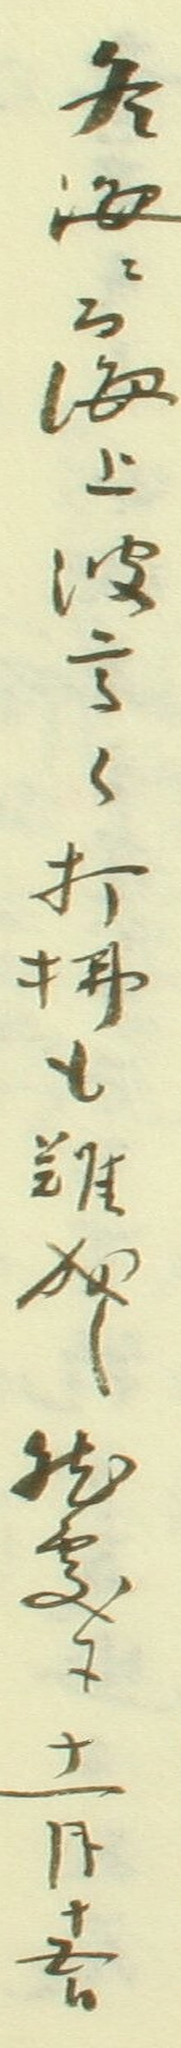冬海に而海上波高く打払も難成し然處に十一月十五日
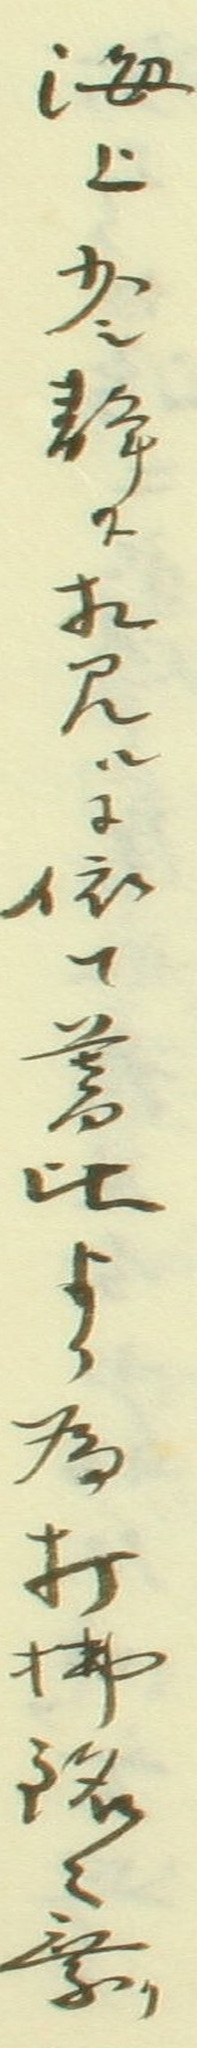海上少し静す相見るに依て暮頃より為打払銘々乗り
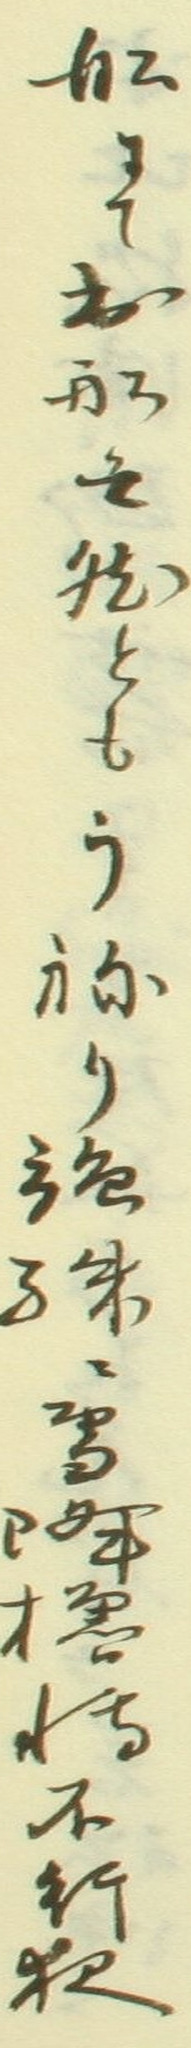船にて出船す然ともうねり絶殊に雪降櫓持不行夜

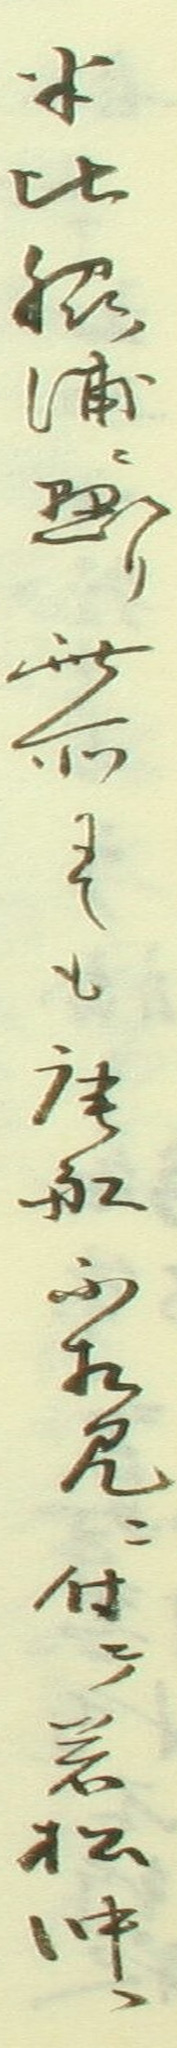半頃紹の浦に懸り此所にても唐船不相見に付て若松沖へ
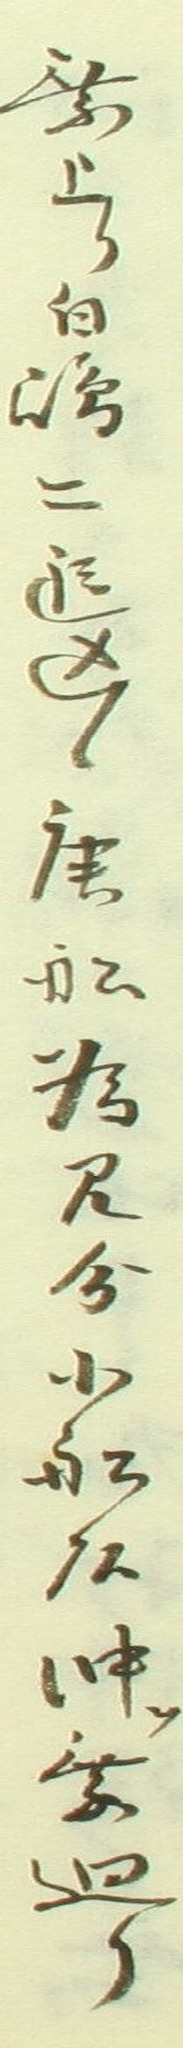乗上り白嶋に追込候唐船為見分小船頭沖に乗廻り
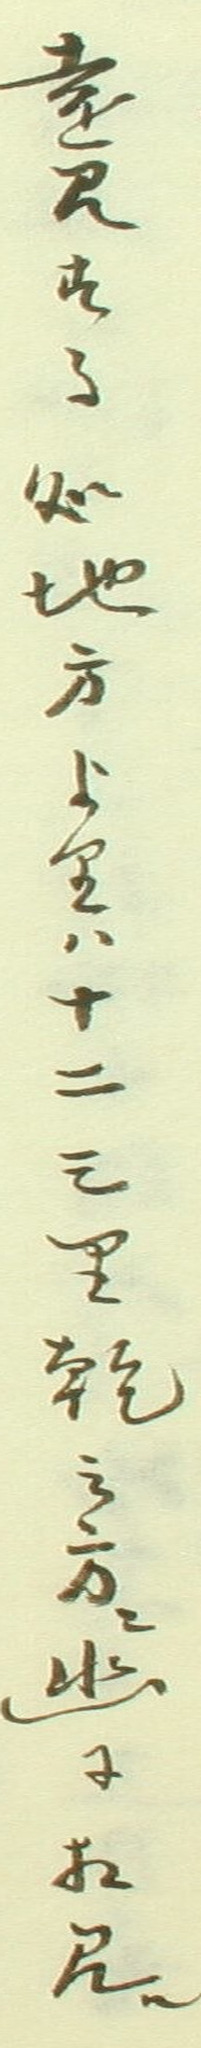遠見する処地方よりは十二三里乾之方に幽に相見る
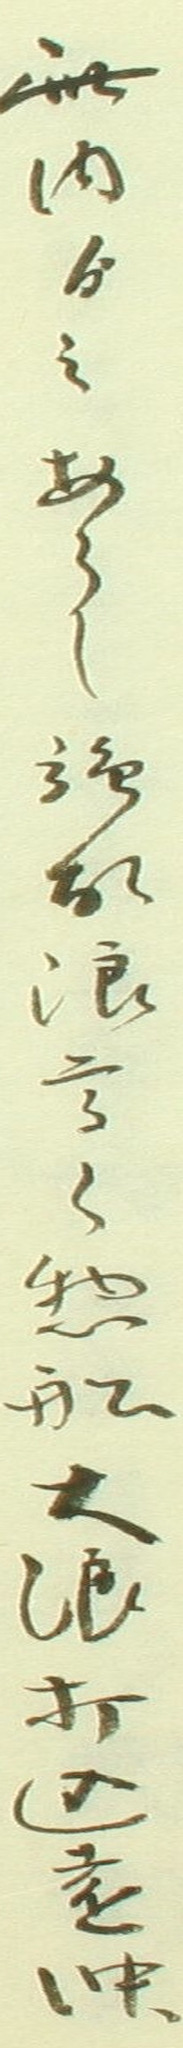此内ゟ之あらし絶なく浪高く惣船大浪打込遠沖へ
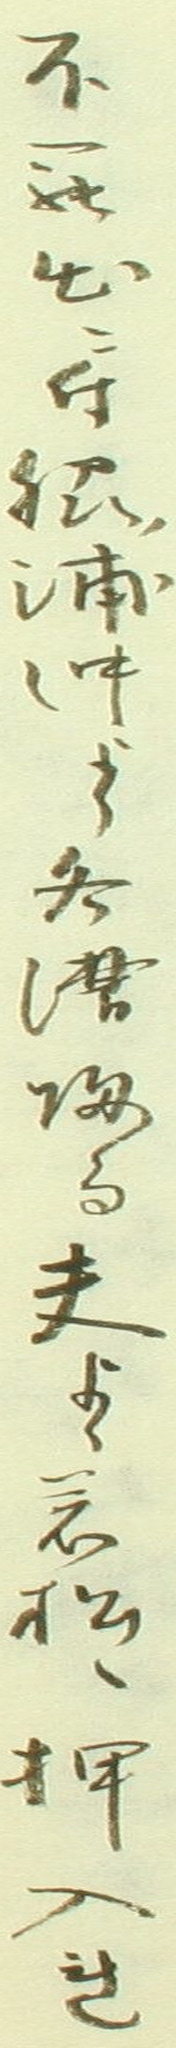不罷出に付紹の浦沖より各漕帰る夫より若松へ押入れ
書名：唐船漂流記 三
